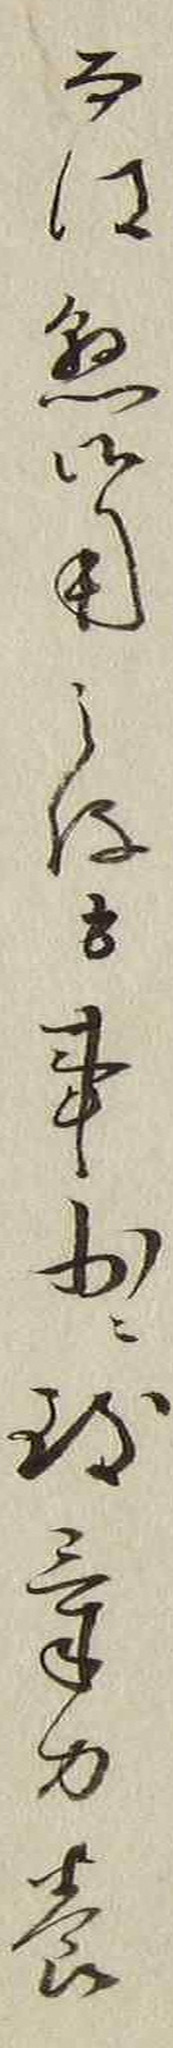而は懸御用之儀も事少に致気力養
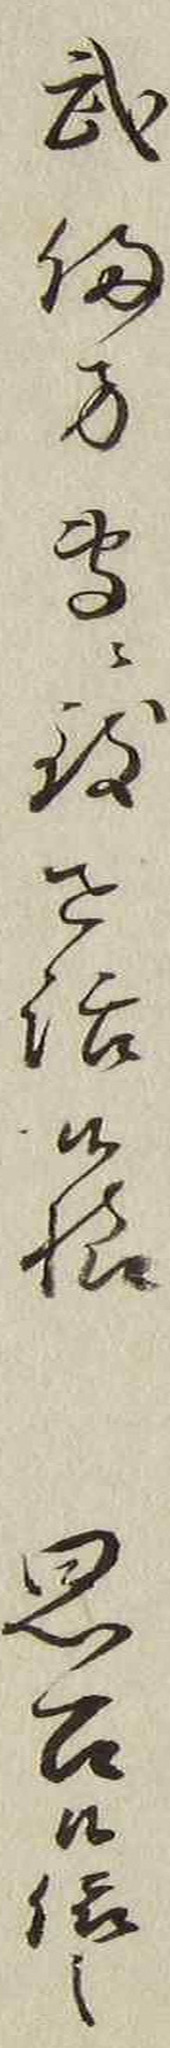武備方専に致を詰候様思召候依之
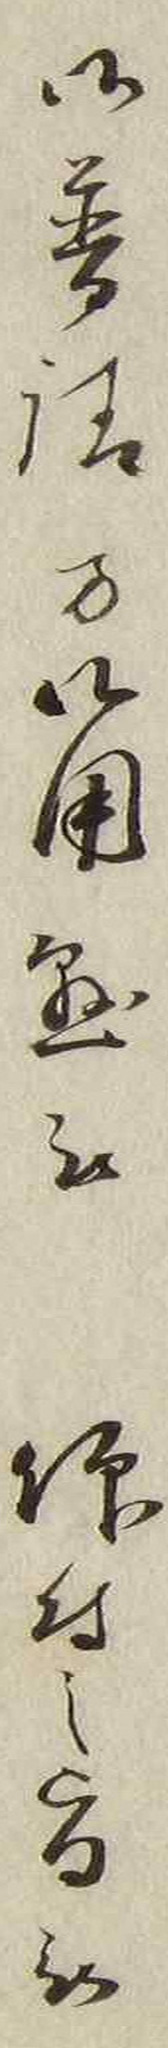御普請方御用懸被仰付之旨被

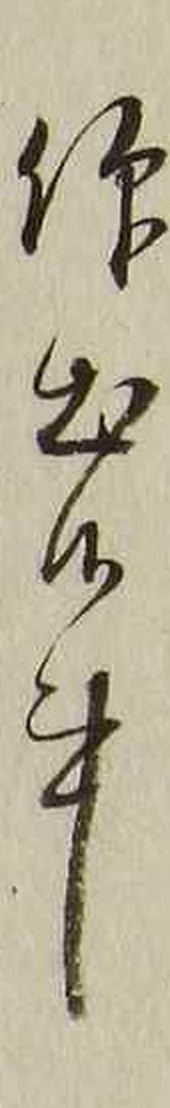仰出候事
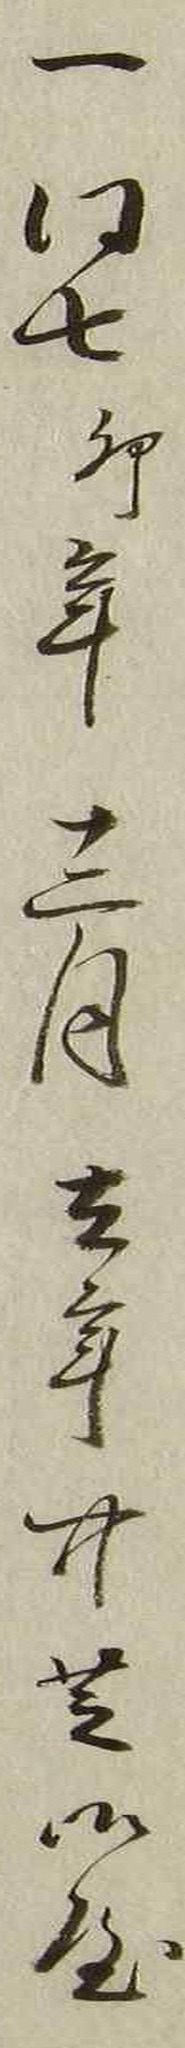一同七卯年十二月去年中芝御屋
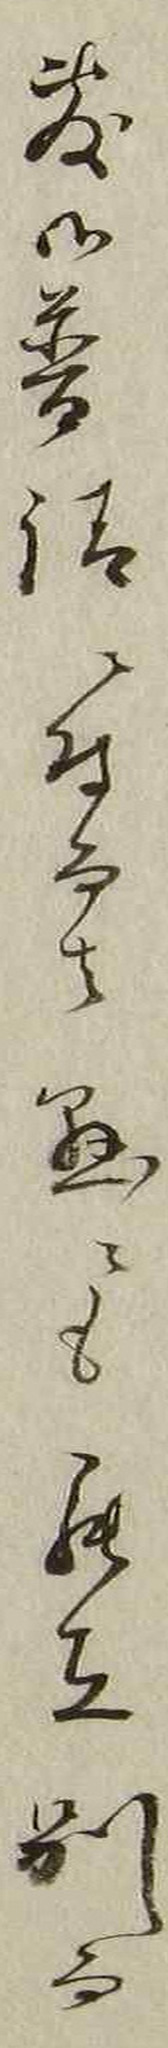敷御普請に付而は懸にも罷在別而
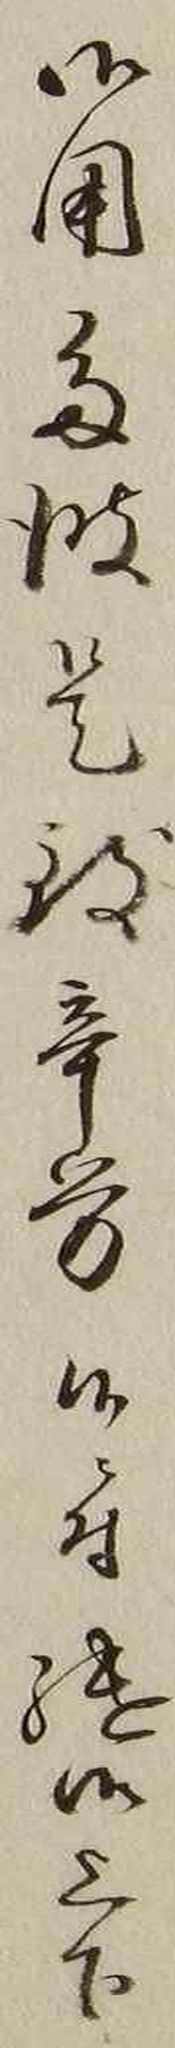御用多彼是致辛労候に付継御上下
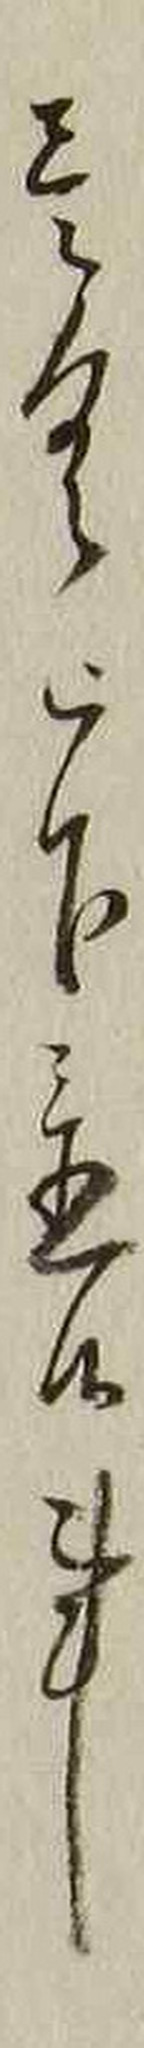壱具被下置候候
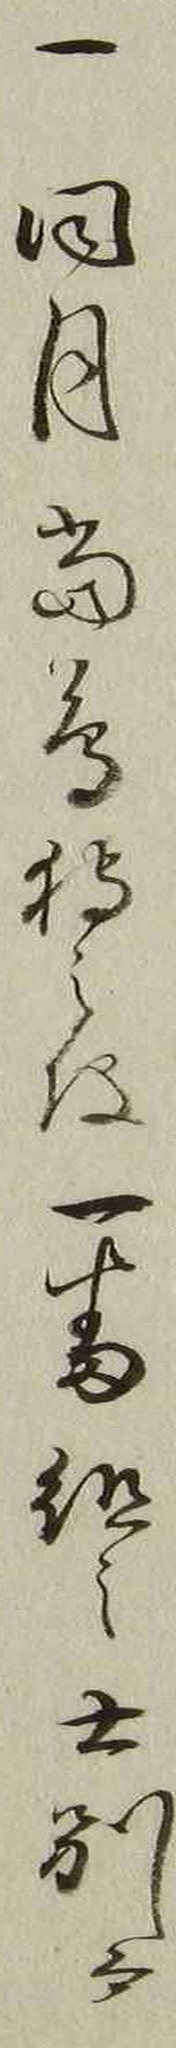一同月当鳥狩之儀一番組之士別而
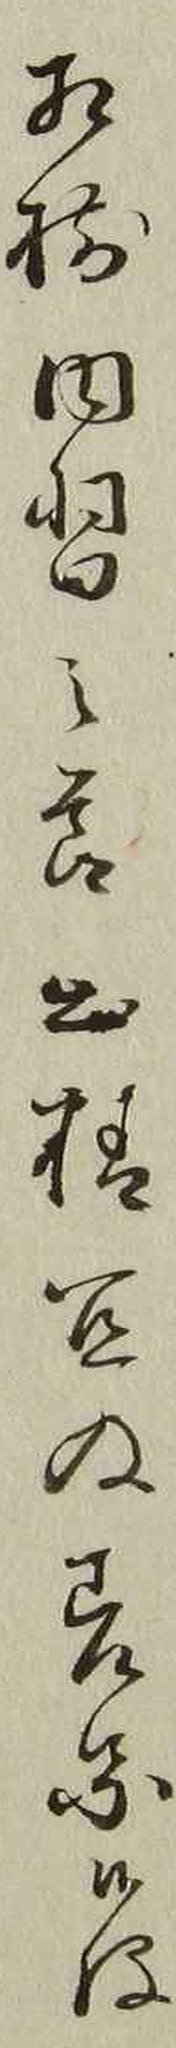相揃内習之節出精宜及差図候儀
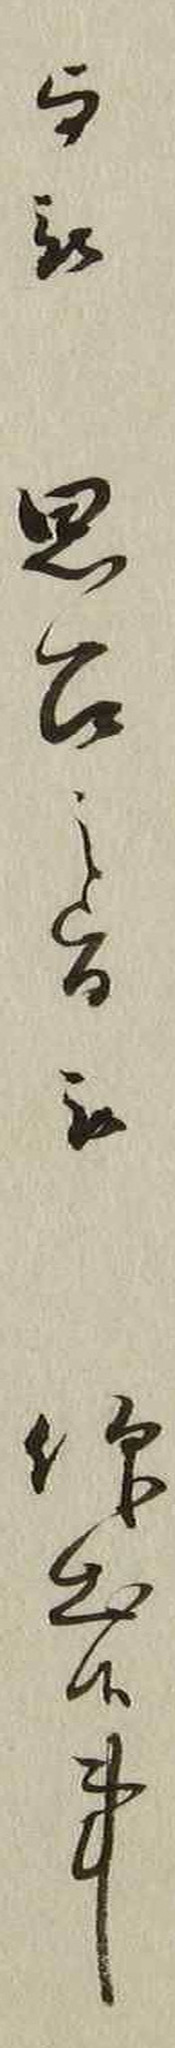と被思召之旨被仰出候事
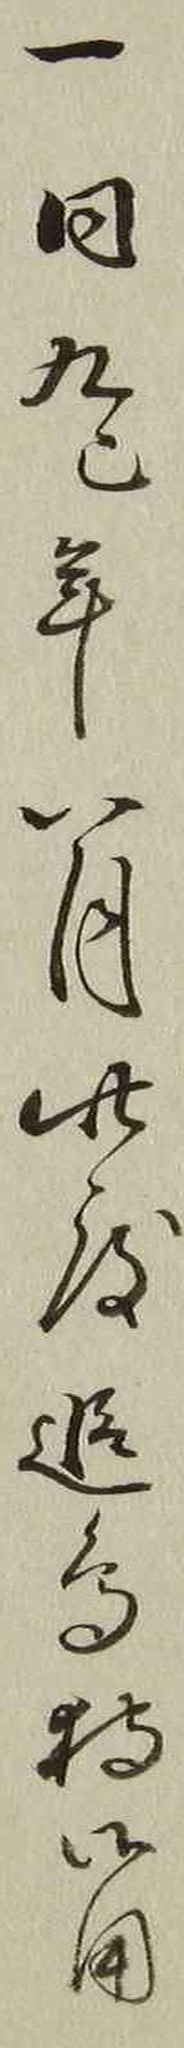一同九巳年八月此度追鳥狩御用
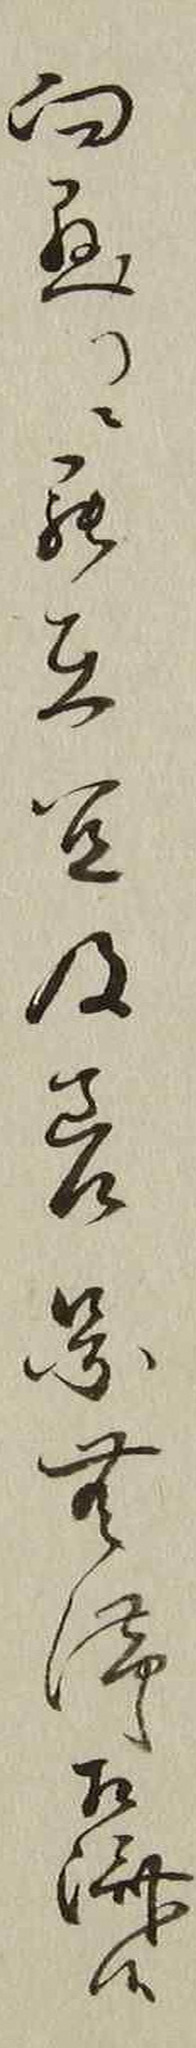向懸りに罷在宜及差図無滞相済候
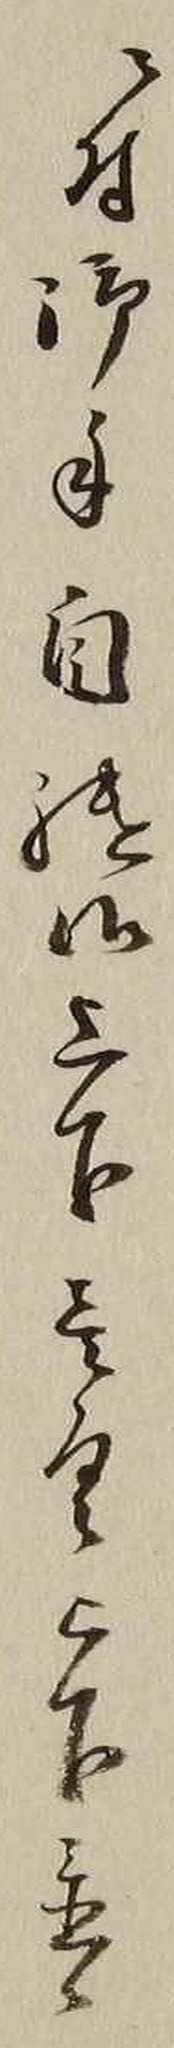に付御手自継御上下壱具被下置候
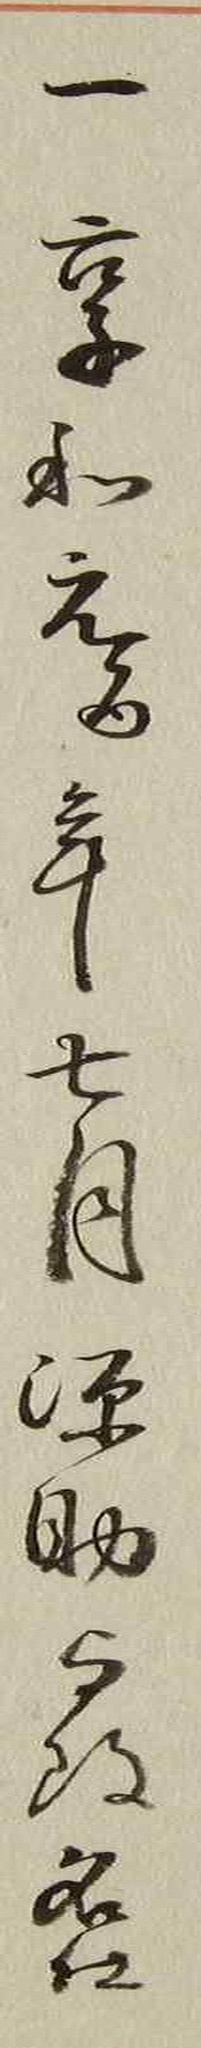一享和元酉年七月源助と改名仕
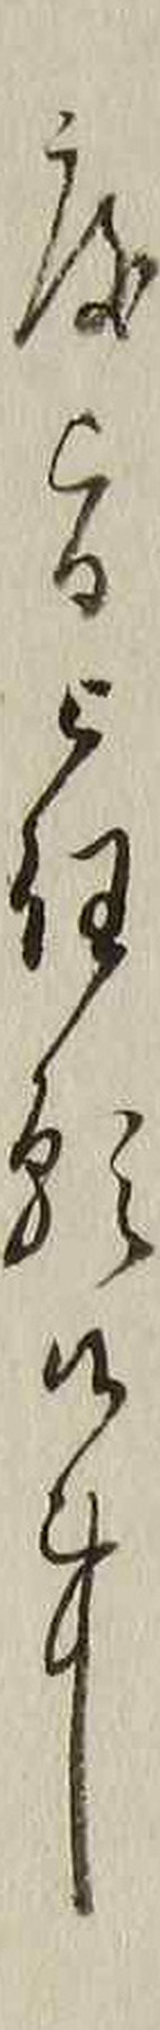度旨被任願候事
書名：諸士系譜　巻之159　な之部1
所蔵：会津若松市立会津図書館
